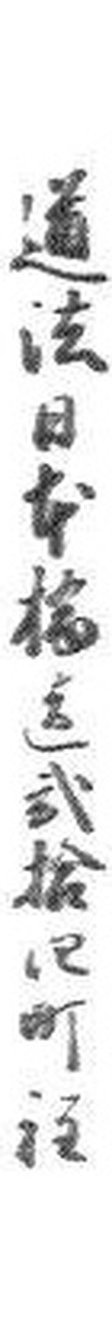道法日本橋まで弐拾四町程
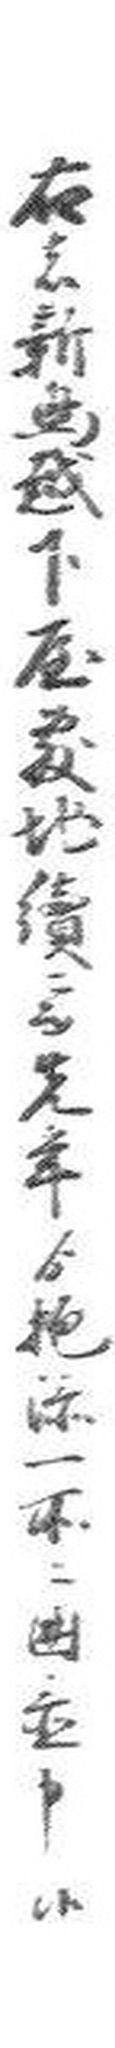右者新鳥越下屋敷地続ニ而先年ゟ抱添一所ニ囲置申候
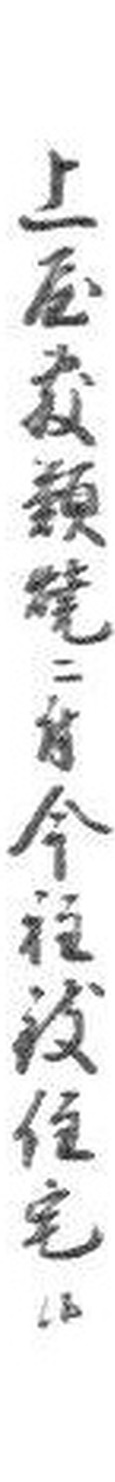上屋敷類焼ニ付今程致住宅候
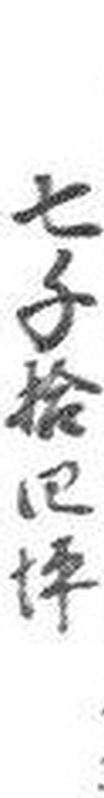七千拾四坪
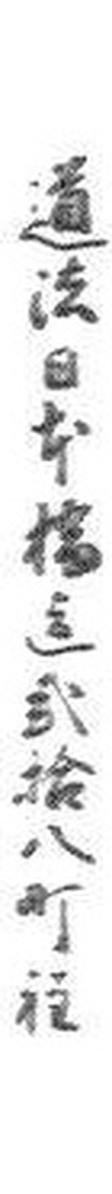道法日本橋迄弐拾八町程
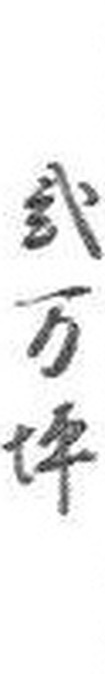弐万坪

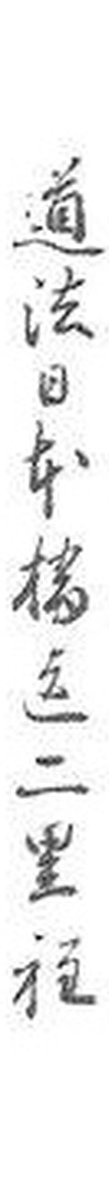道法日本橋迄二里程
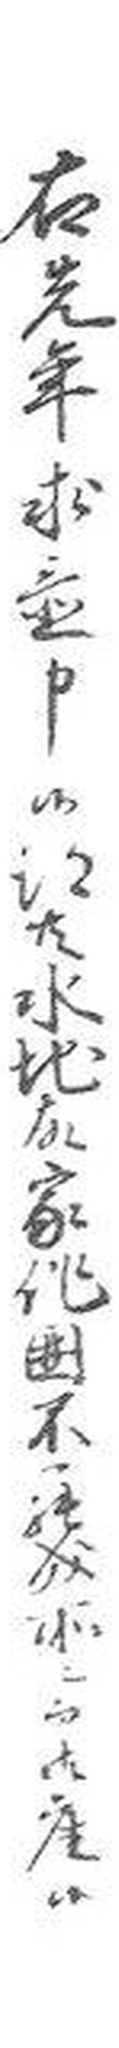右先年求置申候得共水地故家作囲不罷成所ニ而御座候
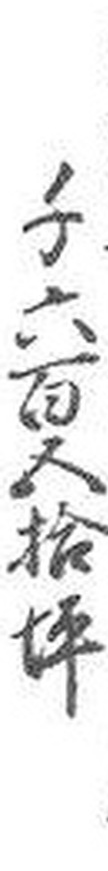千六百五拾坪
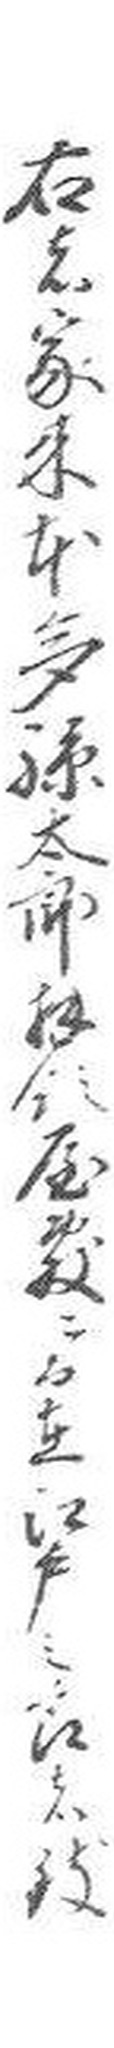右者家来本多孫太郎拝領屋敷ニ而在江戸之節者致
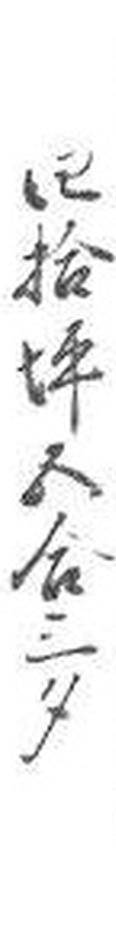四拾坪五合三夕
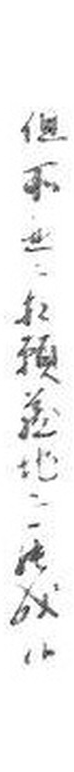但所並ニ相願蔵地ニ罷成候
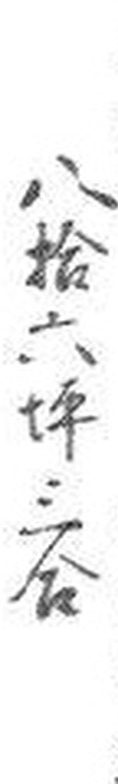八拾六坪三合
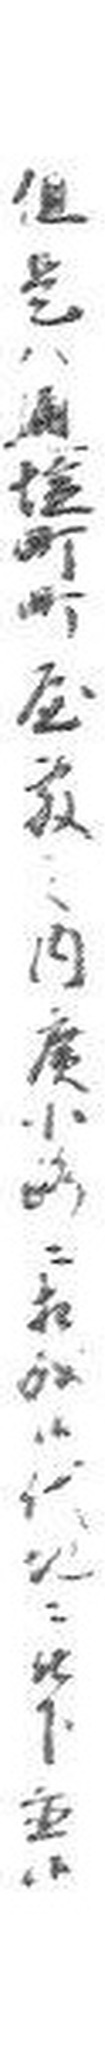但是ハ通塩町町屋敷之内広小路に相成候代地ニ被
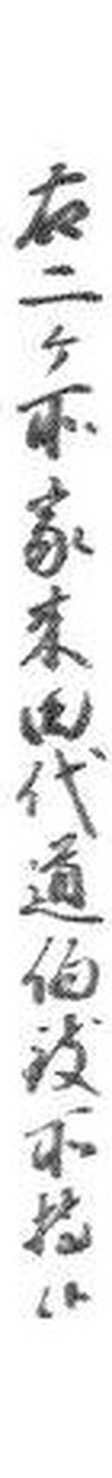右二ケ所家来田代道伯致所持候
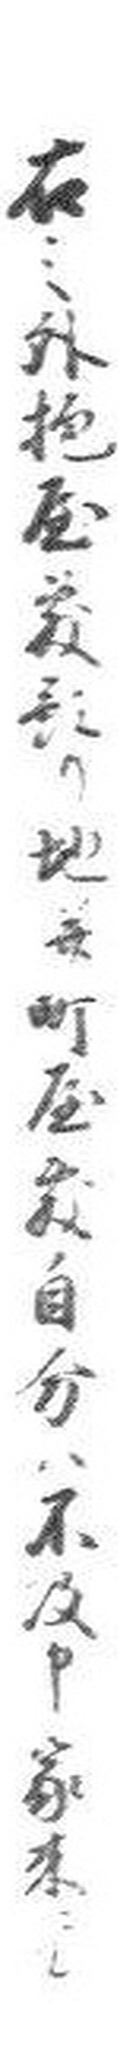右之外抱屋敷預り地并町屋敷自分ハ不及申家来ニも
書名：家譜 二十九 吉邦公 従正徳二年到正徳三年
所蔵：福井県文書館 Fukui Prefectural Archives
